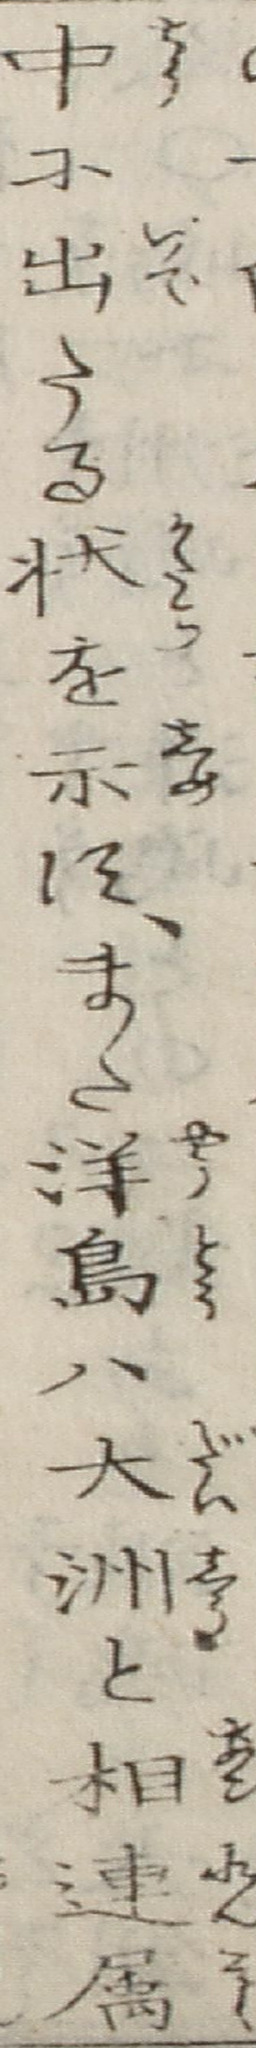中に出たる状を示す、また洋島は大洲と相連属
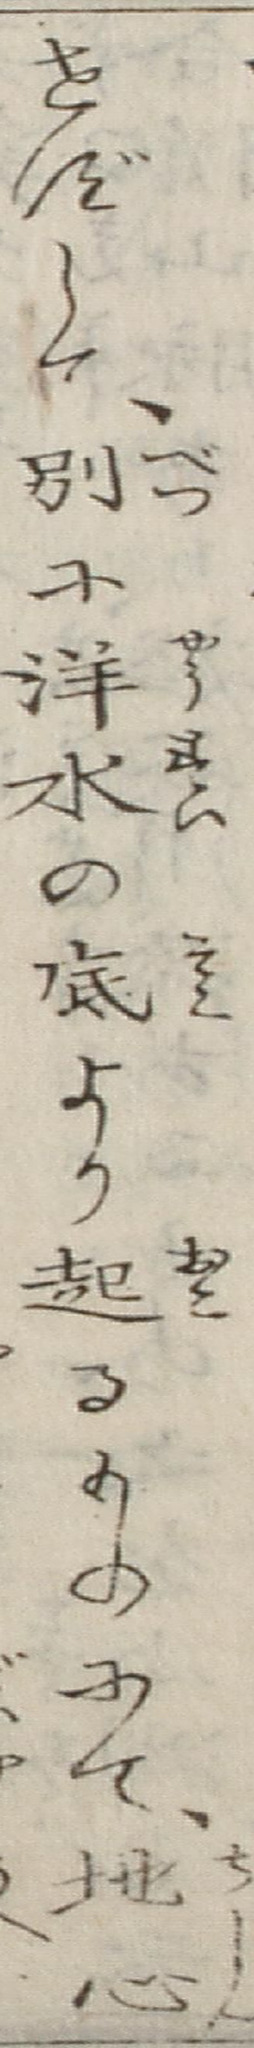せずして、別に洋水の底より起るものにて、地心
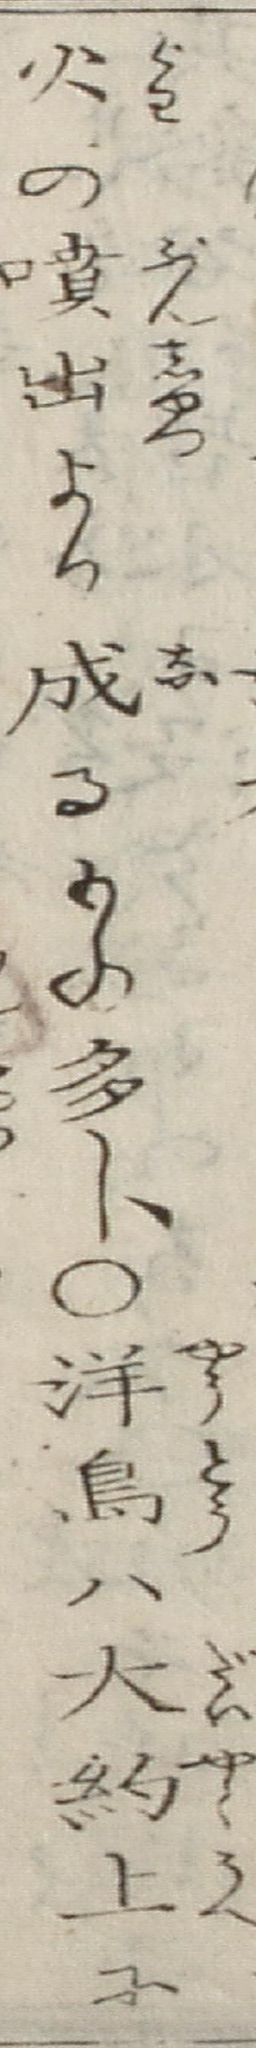火の噴出より成るもの多し、○洋島は大約上に
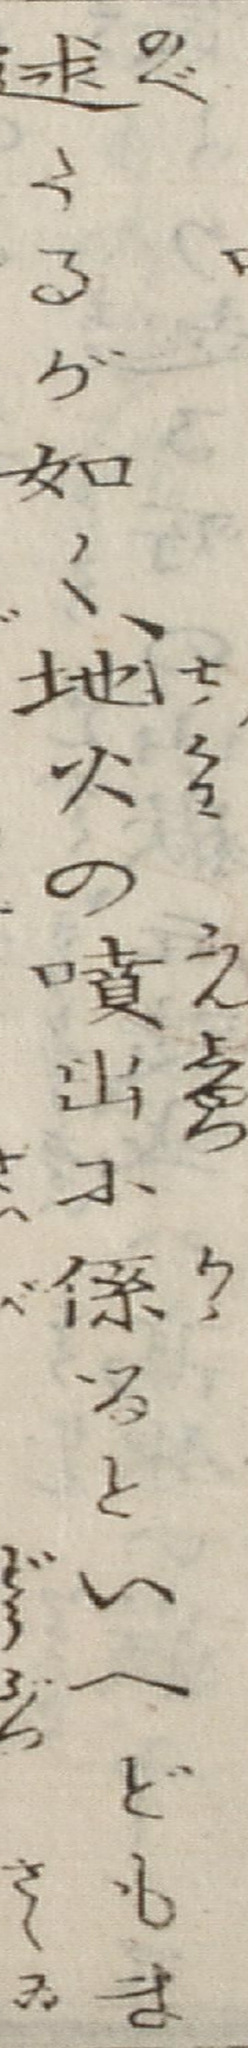述たるが如く、地火の噴出に係るといへどもま
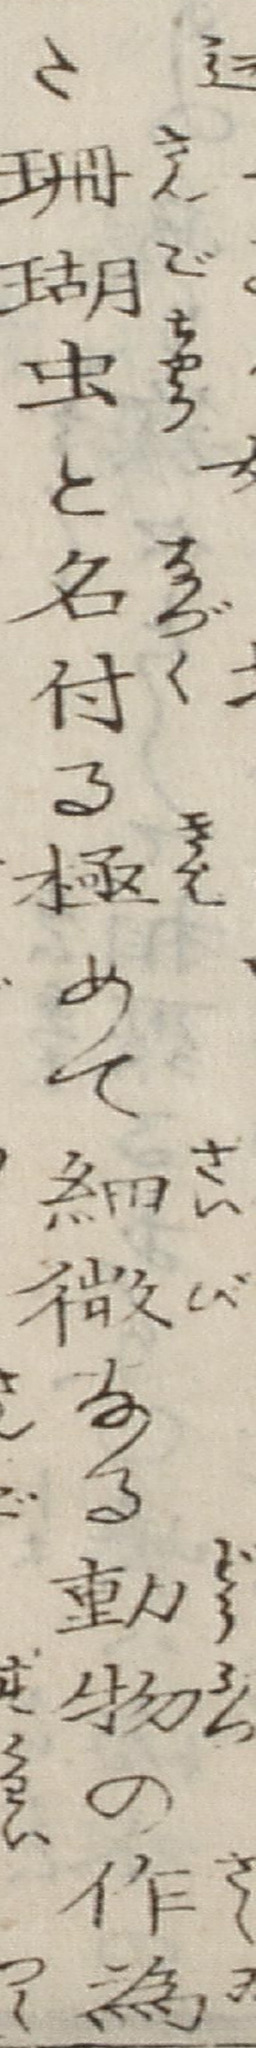た珊瑚虫と名付る極めて細微なる動物の作為
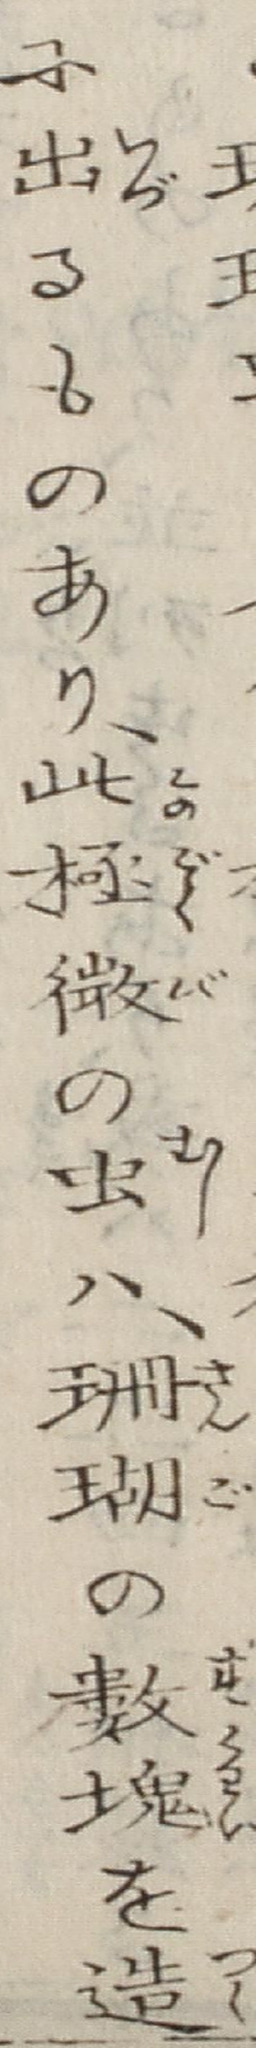に出るものあり、此極微の虫は、珊瑚の数塊を造

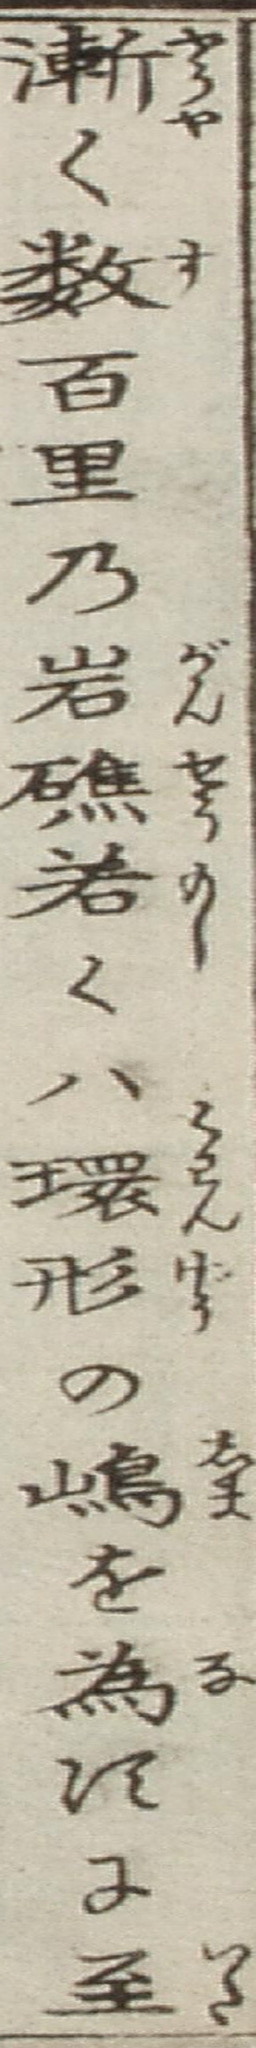漸く数百里乃岩礁若くは環形の嶋を為すに至
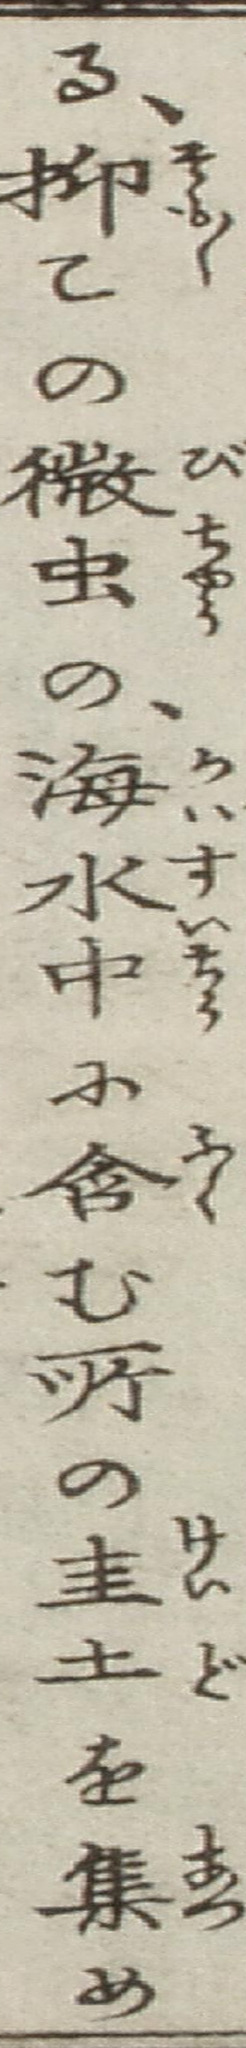る、抑この微虫の、海水中に含む所の圭土を集め
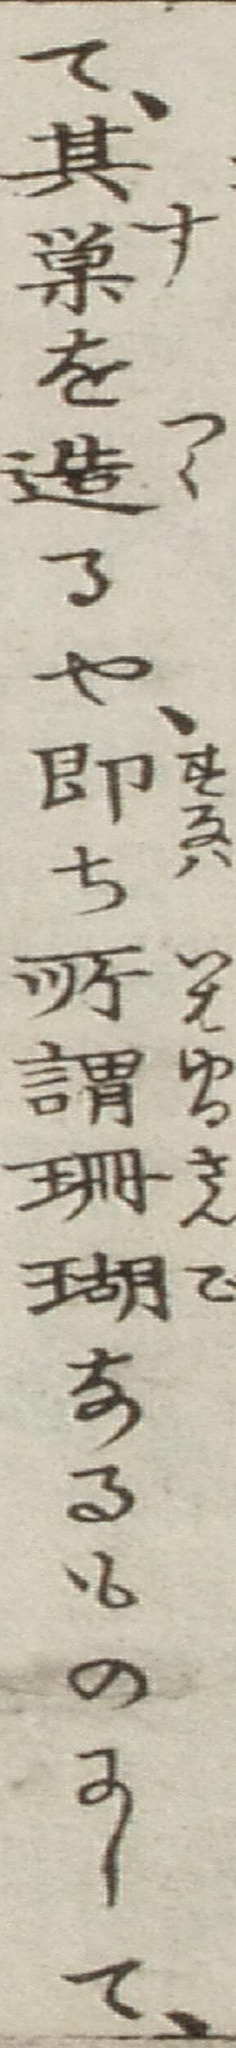て、其巣を造るや、即ち所謂珊瑚なるものにして、
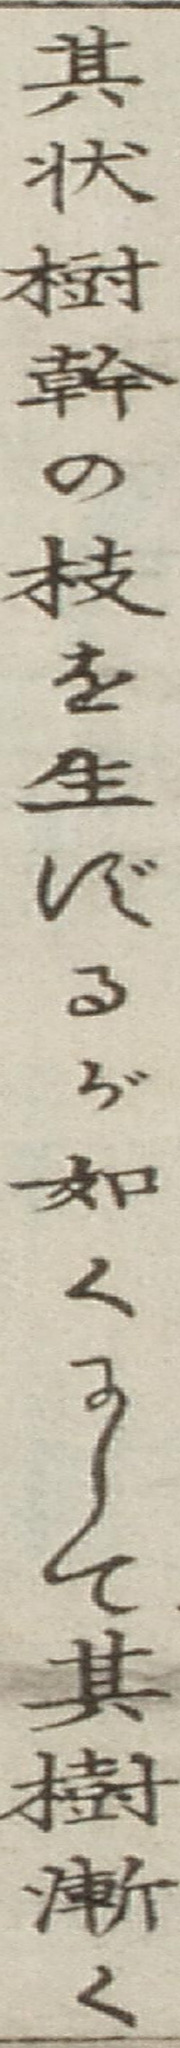其状樹幹の枝を生ずるが如くにして、其樹漸く
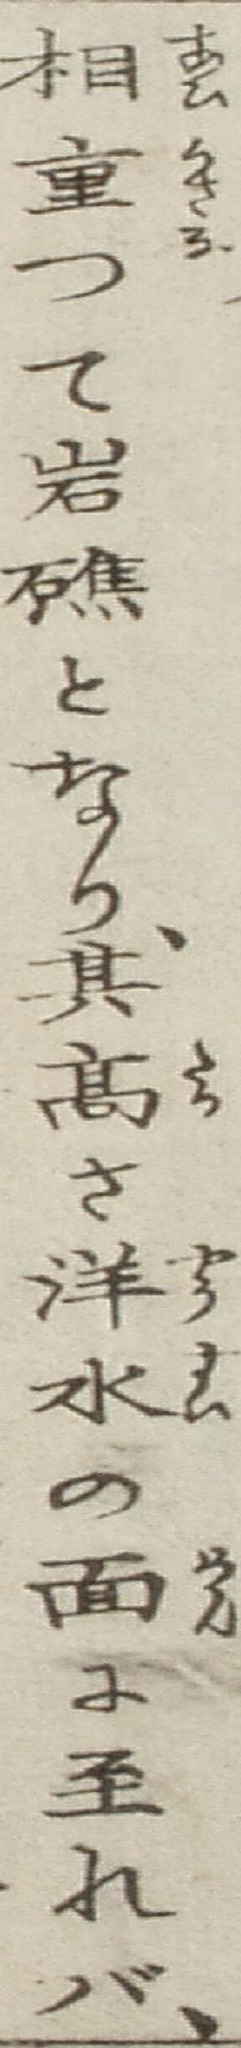相重つて岩礁となり、其高さ洋水の面に至れば、
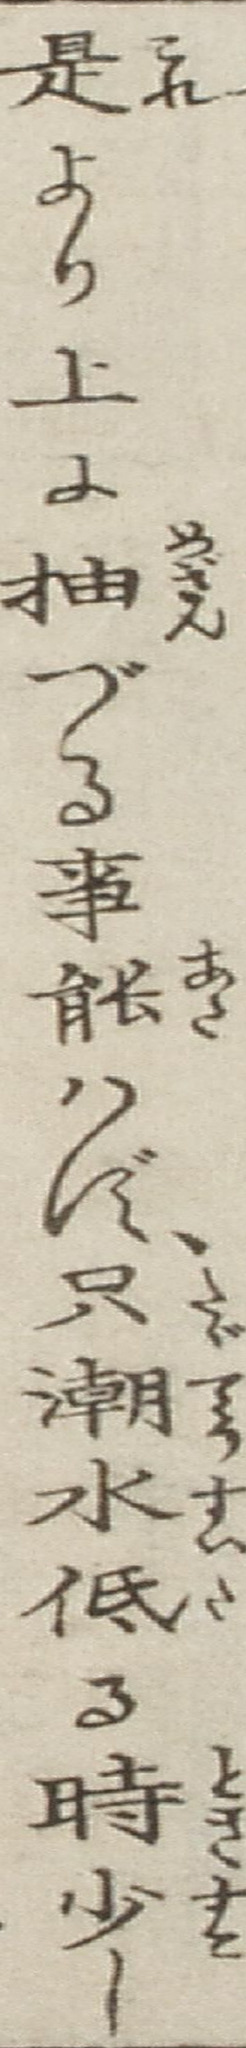是より上に抽づる事能はず、只潮水低る時少し
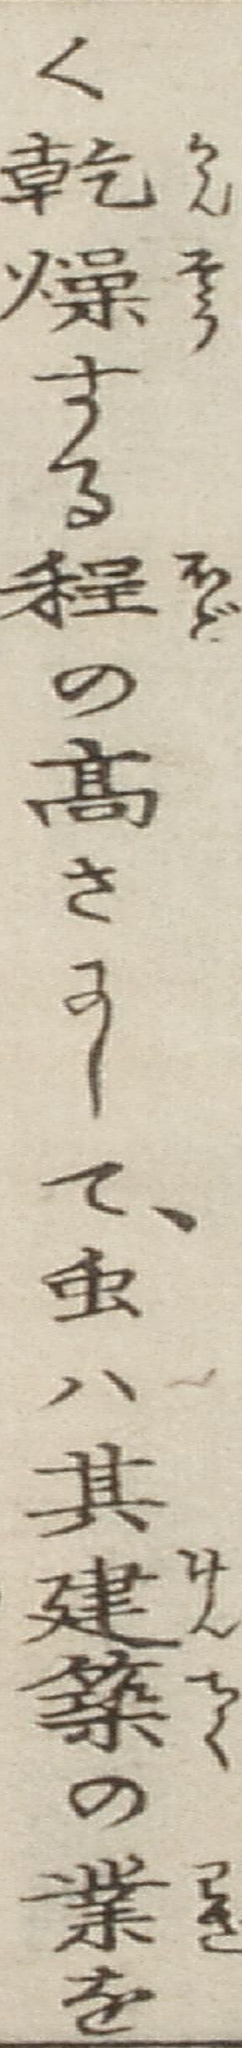く乾燥する程の高さにして、虫は其建築の業を
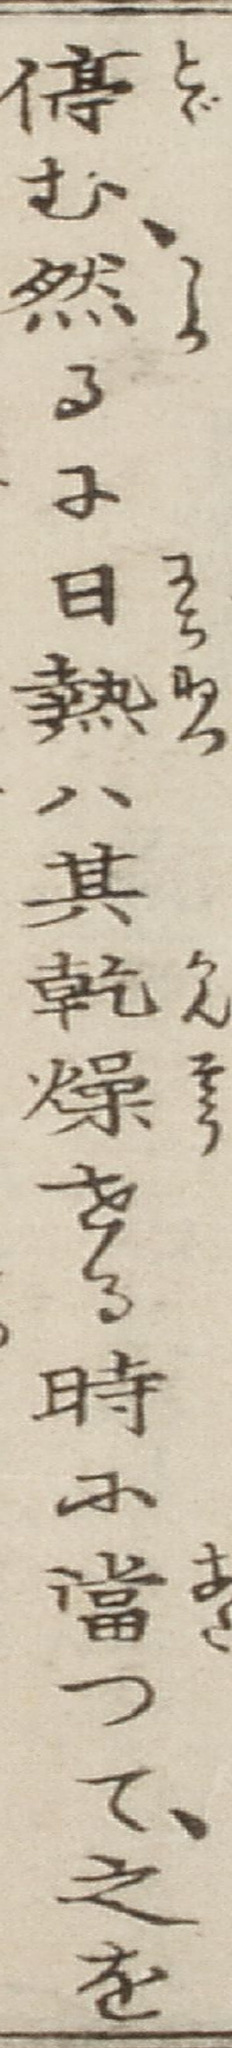停む、然るに日熱は其乾燥せる時に当つて、之を
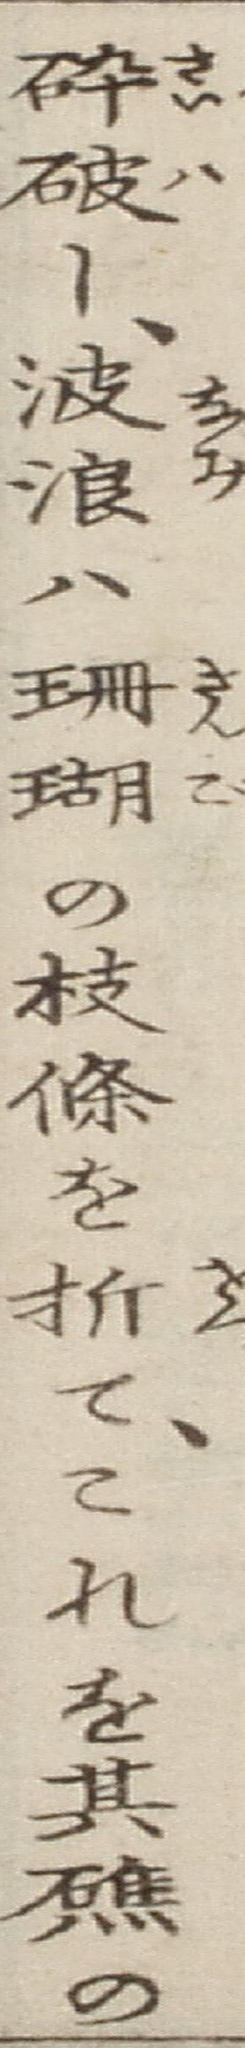砕波し、波浪は珊瑚の枝条を折て、これを其礁の
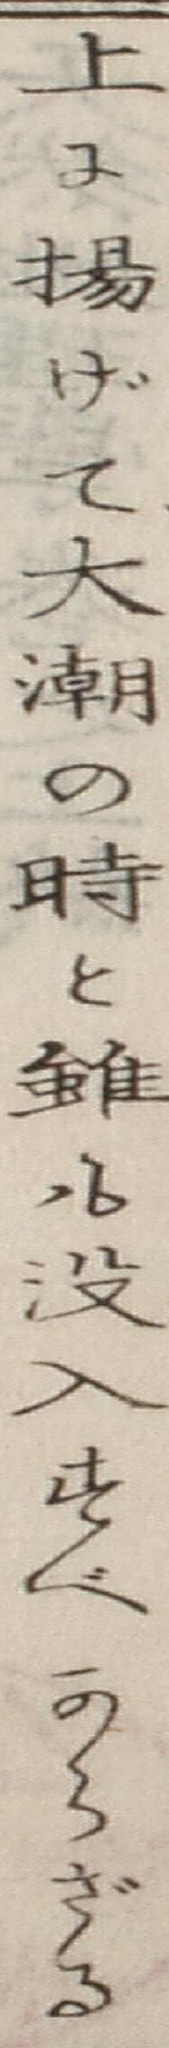上に揚げて、大潮の時と雖も没入すべからざる
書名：訓蒙　天然地理學　上
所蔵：東京大学地震研究所図書室 Earthquake Research Institute Library, The University of Tokyo, JAPAN
